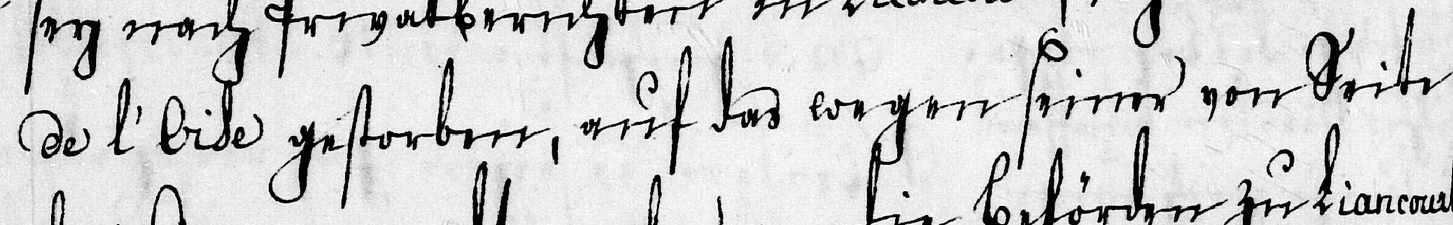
de l’Oide gestorben, auf das wegen seiner von Seite
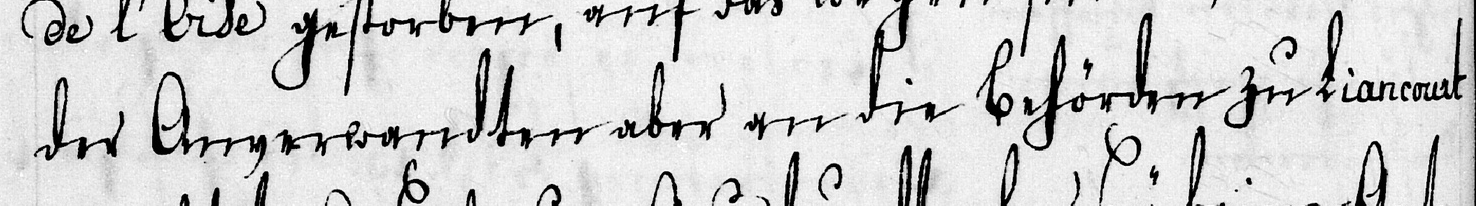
der Anverwandten aber an die Behörden zu Liancou¬
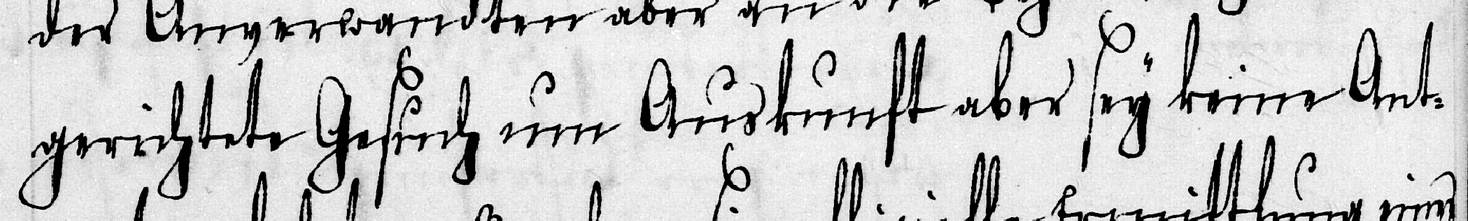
gerichtete Gesuch um Auskunft aber sey keine Ant¬
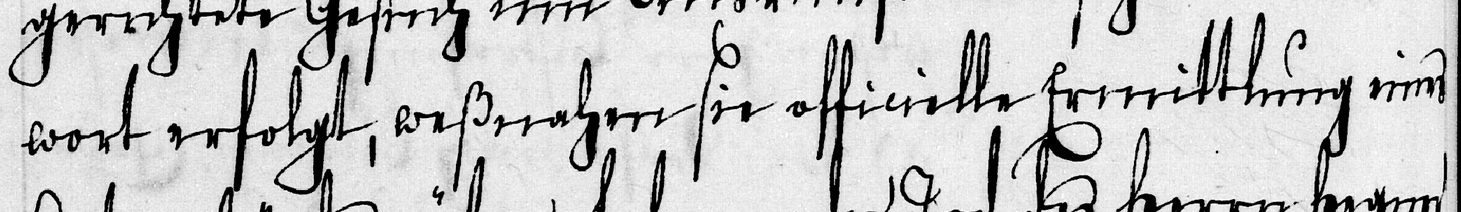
wort erfolgt, weßnahen sie officielle Ermittlung ein¬
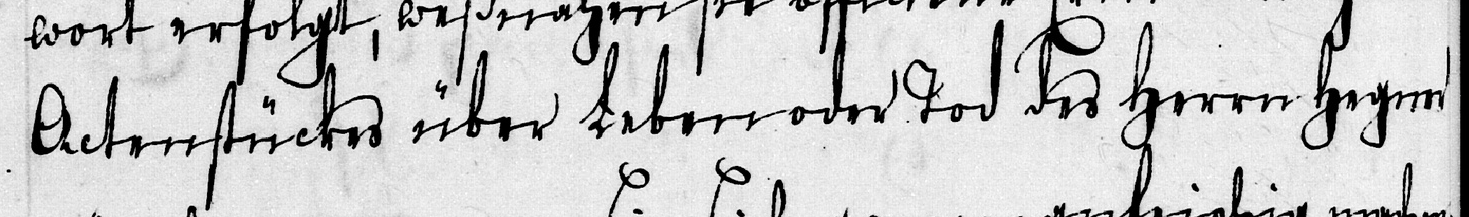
Actenstückes über Leben oder Tod des Herrn Hegner
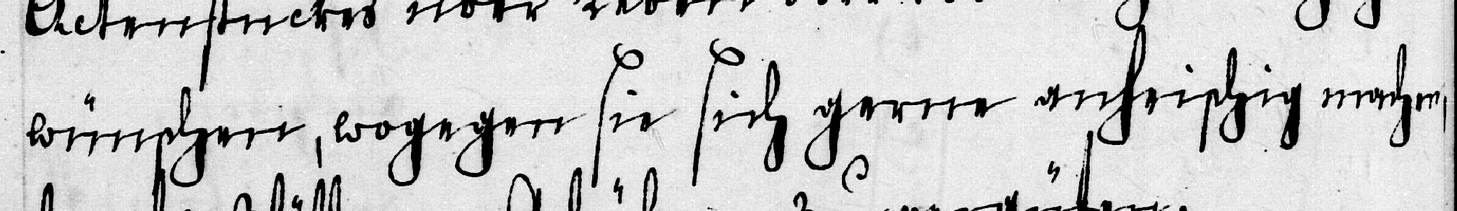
wünschen, wogegen sie sich gerne anheischig machen,
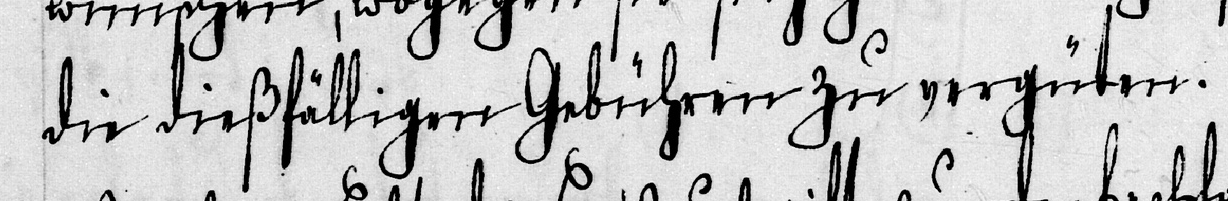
die dießfälligen Gebühren zu vergüten.
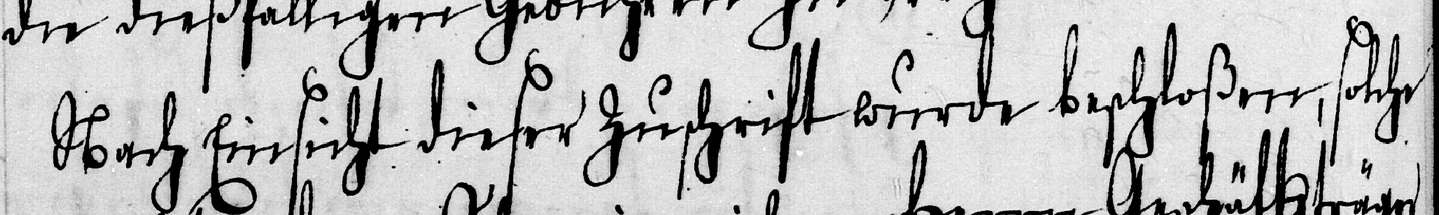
Nach Einsicht dieser Zuschrift wurde beschloßen, solc¬
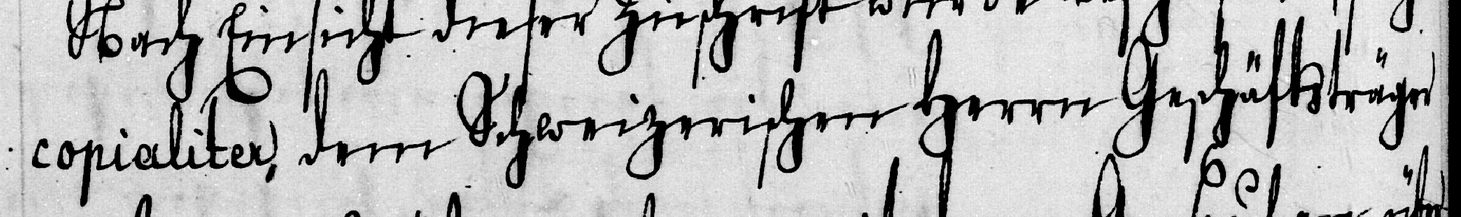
copialiter dem Schweizerischen Herrn Geschäftsträger
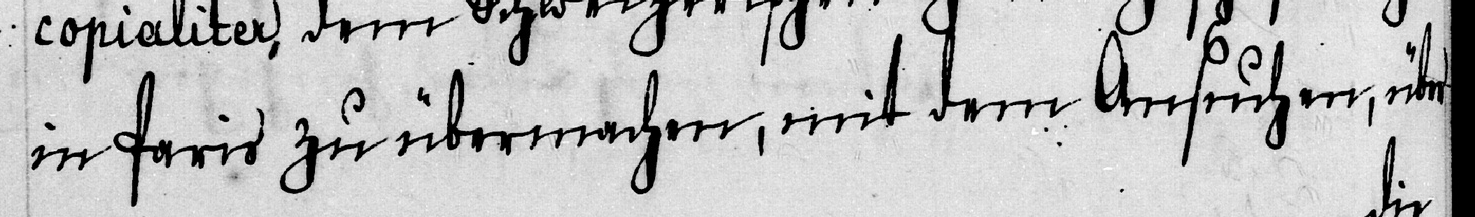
in Paris zu übermachen, mit dem Ansuchen, über
